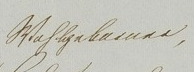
Wohlgeborner,
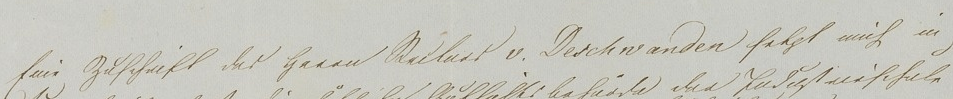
Eine Zuschrift der Herrn Rectors v. Deschwanden setzt mich in
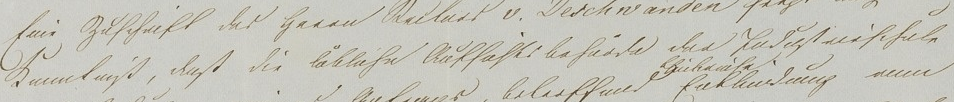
Kenntniß, daß die löbliche Aufsichtsbehörde der Industrieschule
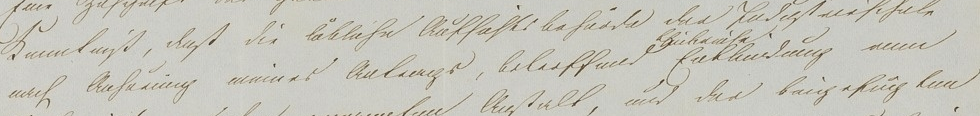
nach Anhörung meines Antrags, betreffend theilweise Entbindung vom
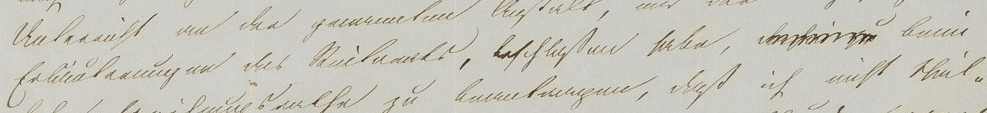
Erläuterungen des Rectorats, beschlossen habe, d......u beim
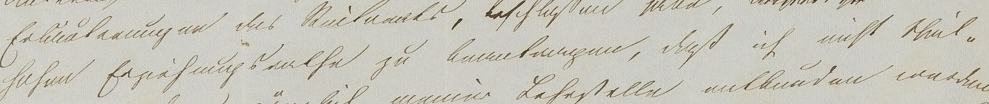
hohen Erziehungsrathe zu beantragen, daß ich nicht theil-
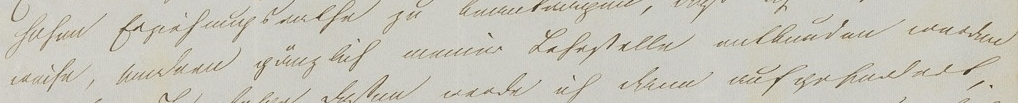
weise, sondern gänzlich meiner Lehrstelle entbunden werden
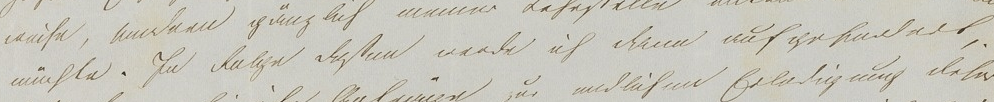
möchte. In Folge dessen werde ich dann aufgefordert,
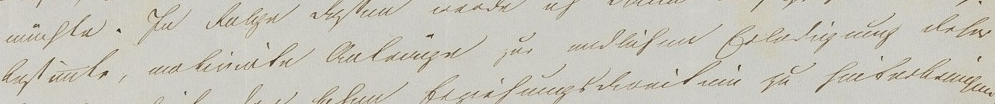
bestimmte, motivirte Anträge zur endlichen Erledigung dieser
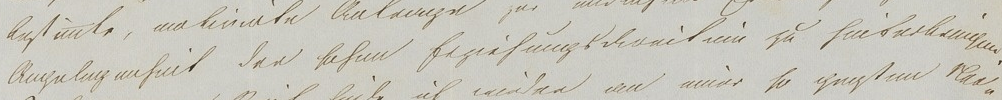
Angelegenheit der hohen Erziehungsdirection zu hinterbringen.
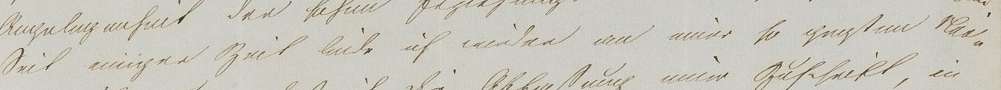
Seit einiger Zeit leide ich wieder an einer so ernsten Ner-
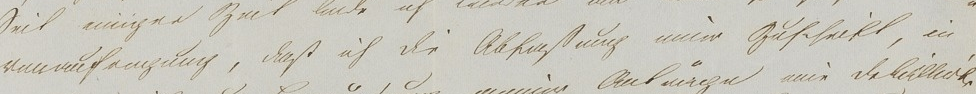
venaufregung, daß ich die Abfassung einer Zuschrift, in
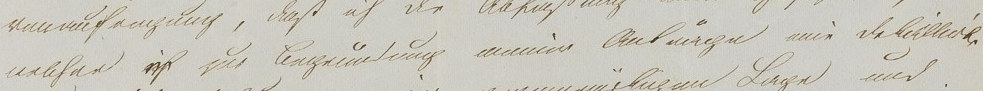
welcher ich zur Begründung meiner Anträge eine detaillirte
